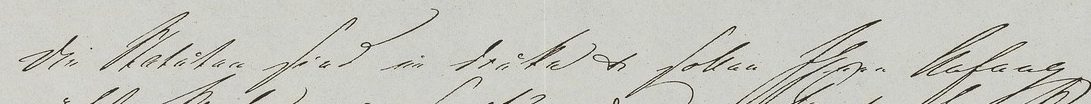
Die Statuten sind im Druke & sollen Ihnen Anfang
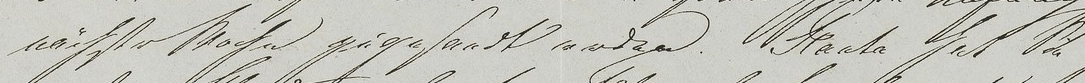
nächster Woche zugesandt werden. Planta hat Sie
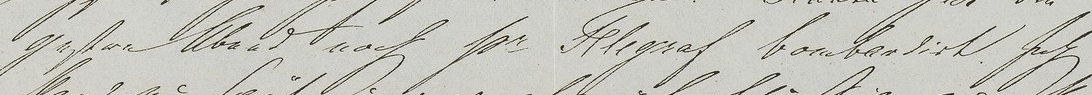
gestern Abend pr Telegraf bombardirt. Ich
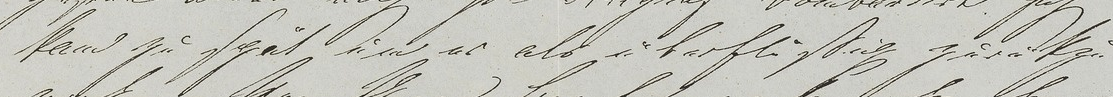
kam zu spät um es als überflüssig zurükzu-
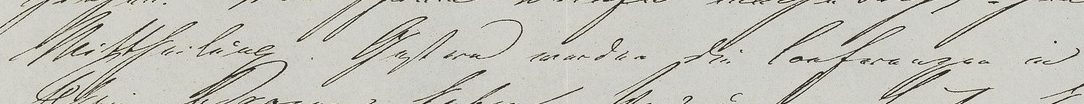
Mittheilung. Gestern werden die Conferenzen in
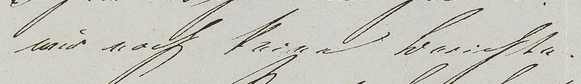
wir noch keine Berichte.
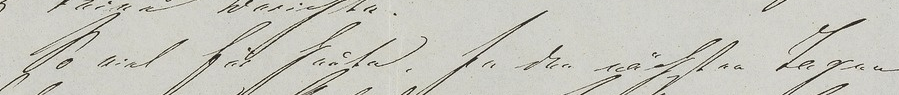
So viel für Heute. In den nächsten Tagen
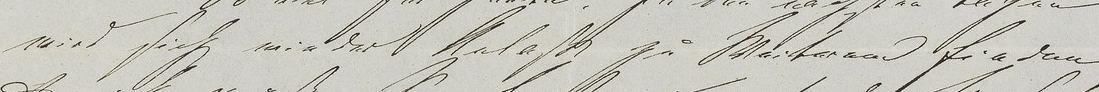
wird sich wieder Anlaß zu Weiterem finden
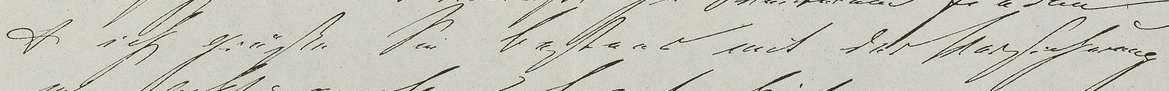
& ich grüße Sie bestens mit der Versicherung
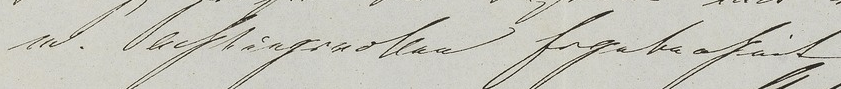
m. achtungsvollen Ergebenheit.
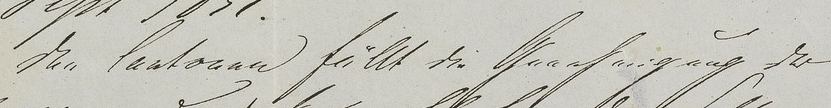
Den Cantonen fällt die Genehmigung der
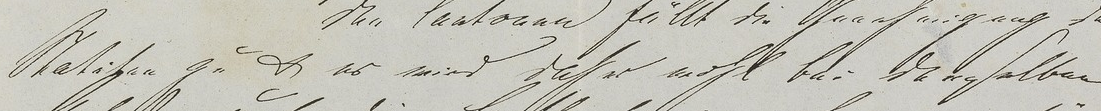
Statuten zu & es wird daher wohl bei demselben
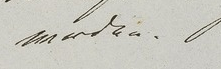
werden.
